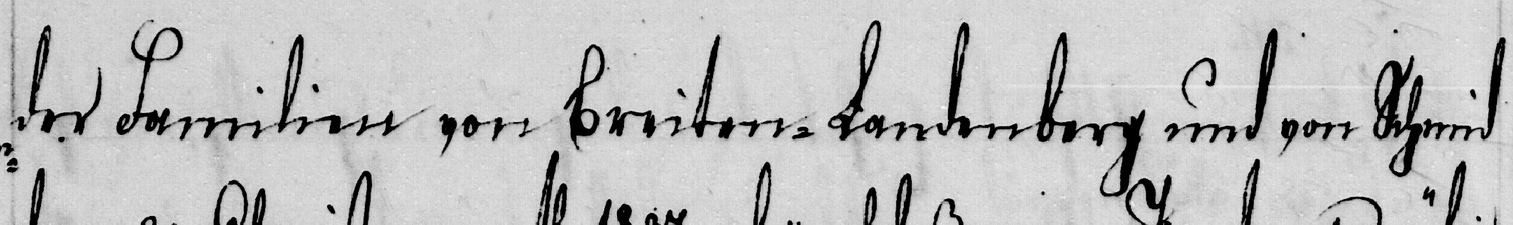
der Familien von Breiten-Landenberg und Schmid
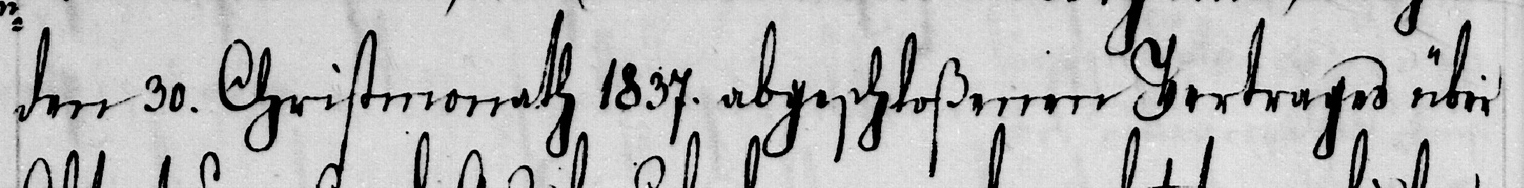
den 30. Christmonath 1837. abgeschloßenen Vertrages über
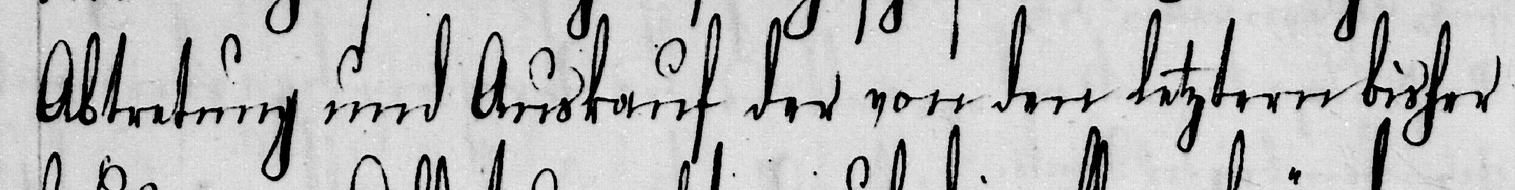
Abtretung und Auskauf der von den letzten bisher
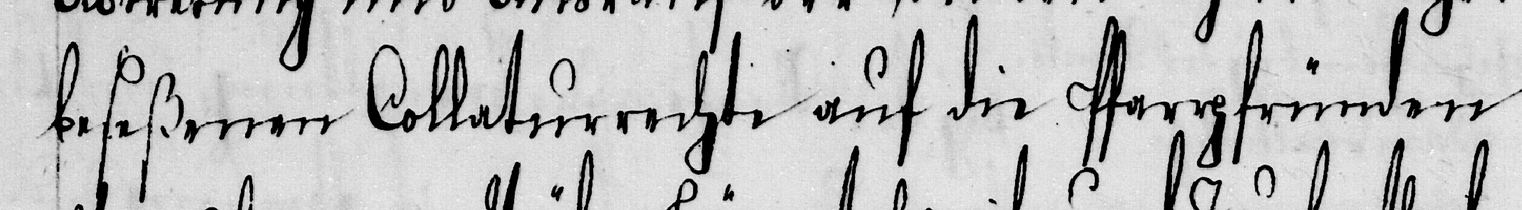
beseßenen Collaturrechte auf die Pfarrgemeinden
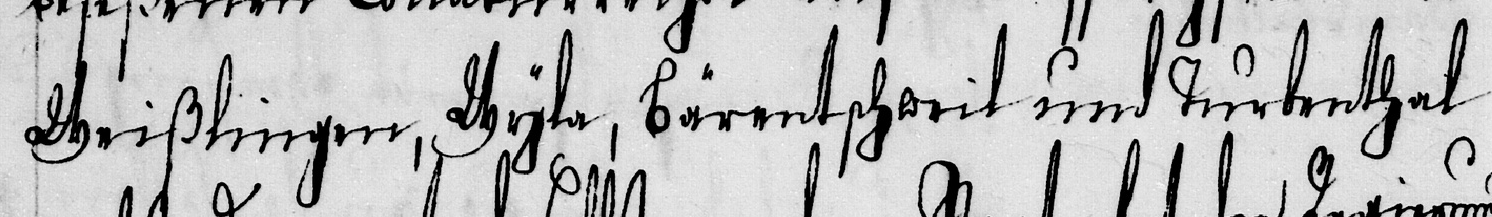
Weißlingen, Wyler, Bärentschweil und Turbenthal
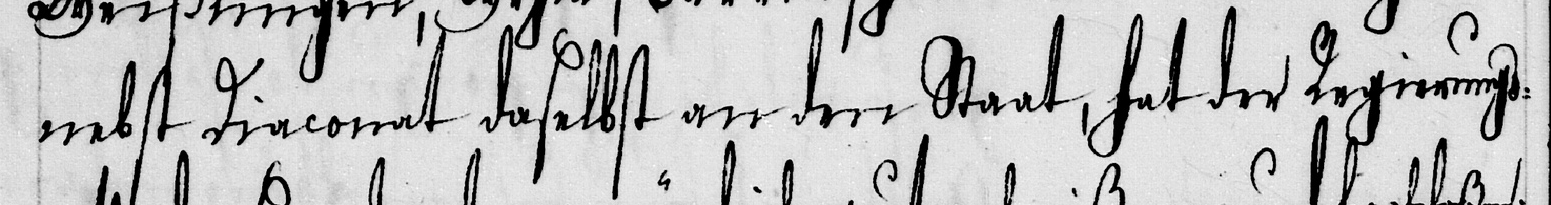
nebst Diaconat daselbst an den Staat, hat der Regieru¬
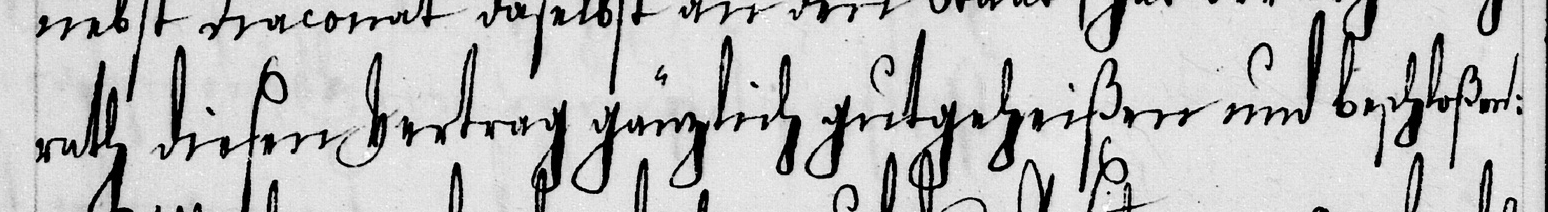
rath diesen Vertrag gänzlich gutgeheißen und beschloß¬
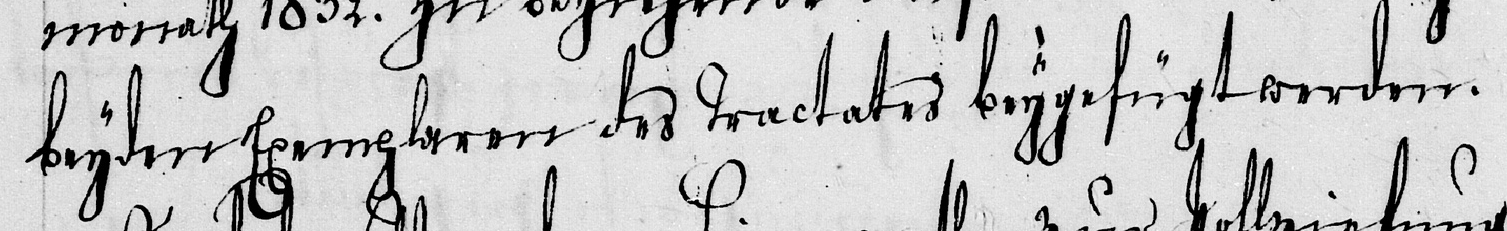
beyden Exemplaren des Tractats beygefügt werden.
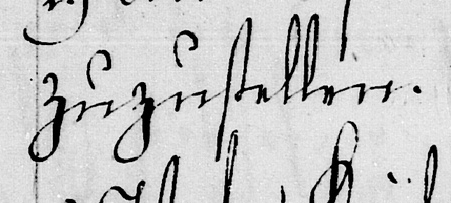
zuzustellen.
